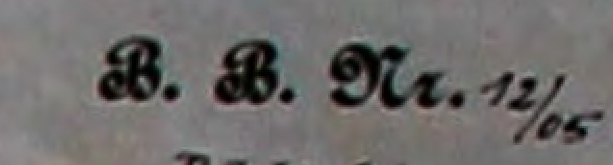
B. B. Nr. 12/05
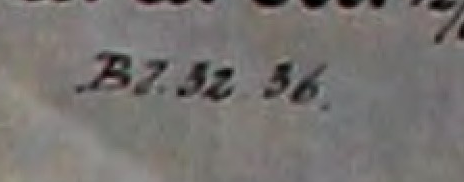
B?. 32. 36.
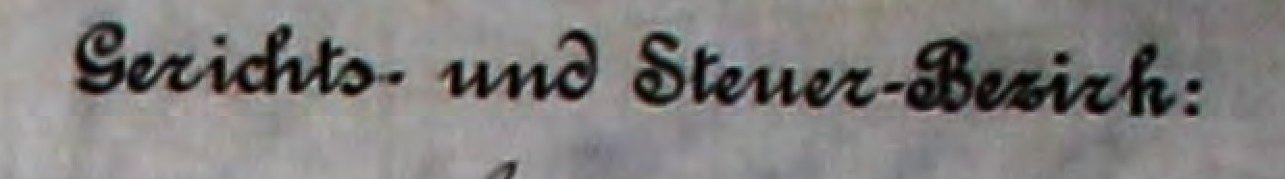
Gerichts- und Steuer-Bezich:
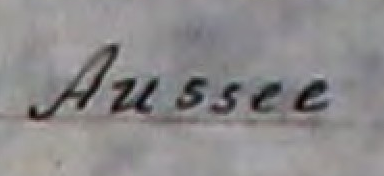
Aussee
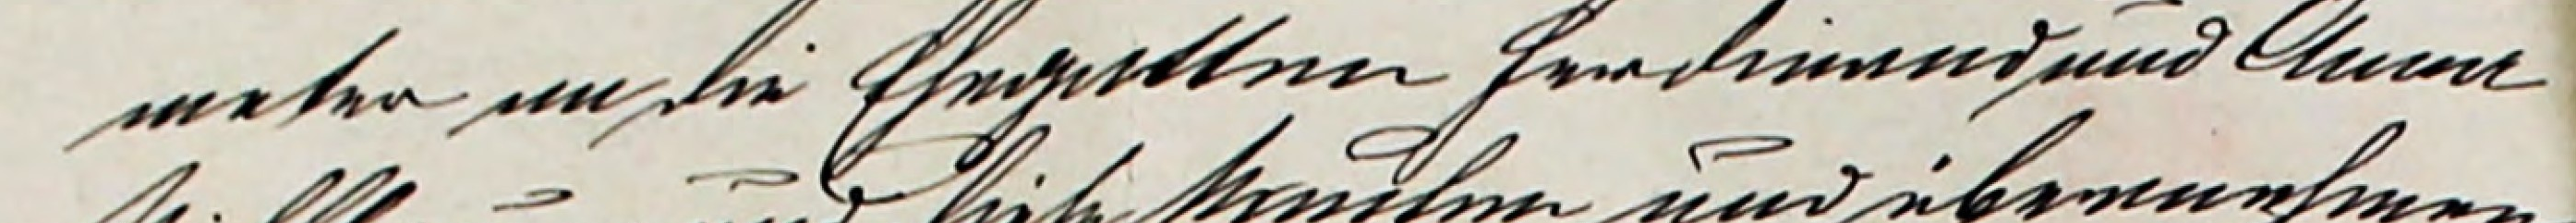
meter an die Ehegatten Ferdinand und Anna
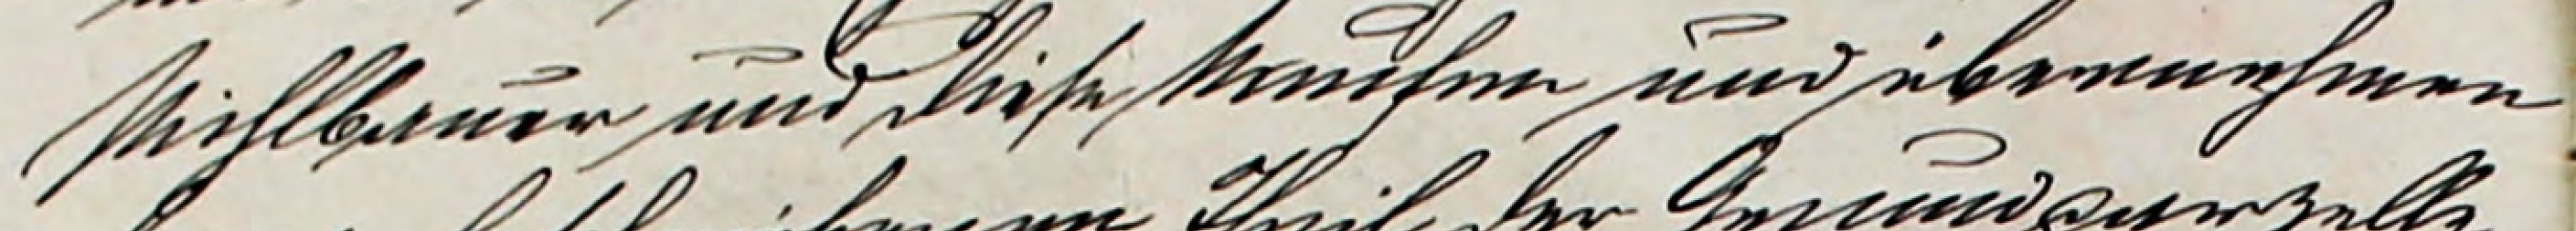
Pichlbauer und diese Maufen und überaghmen
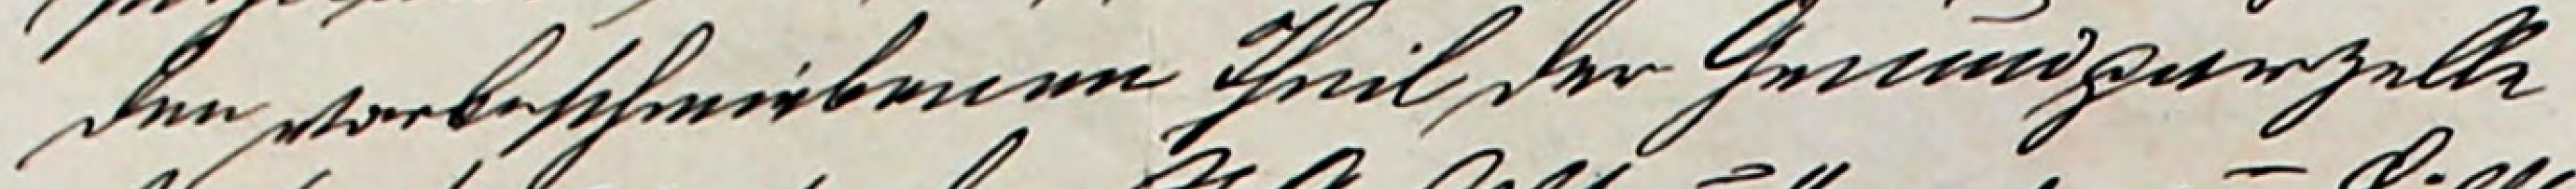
den vorbeschriebenen Theil der Grundparzelle
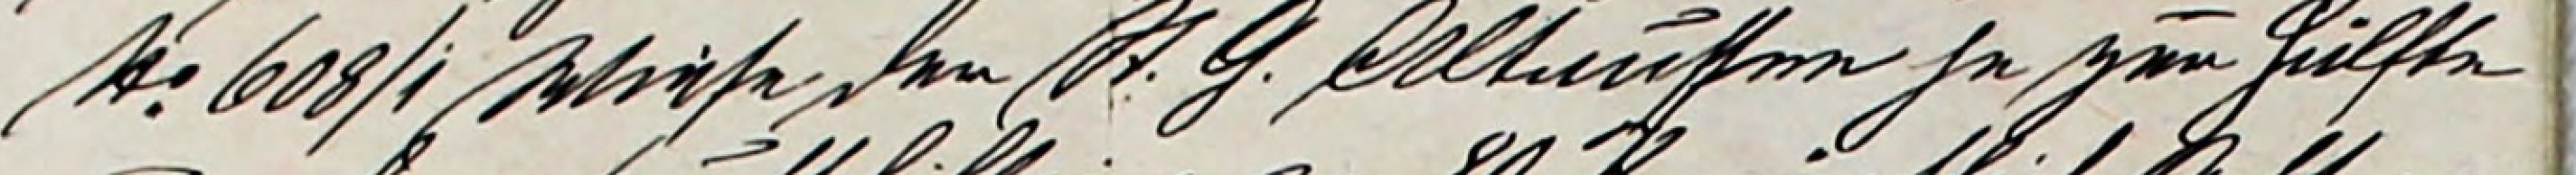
No 608/1 Wiese der St.G. Altaussee je zur Hälfte
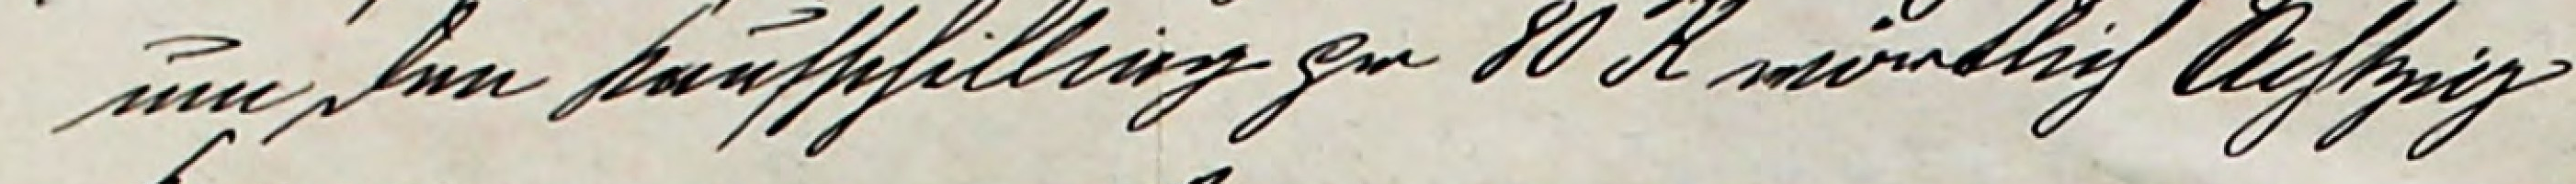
um den Kaufschilling pr 80 K wörtlich Achtzig
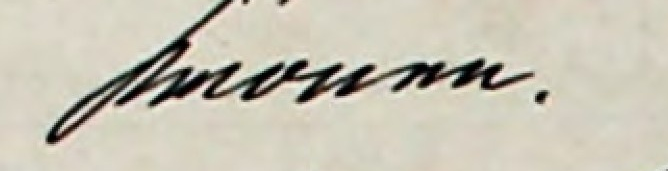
Kronen.
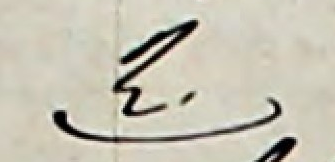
2.
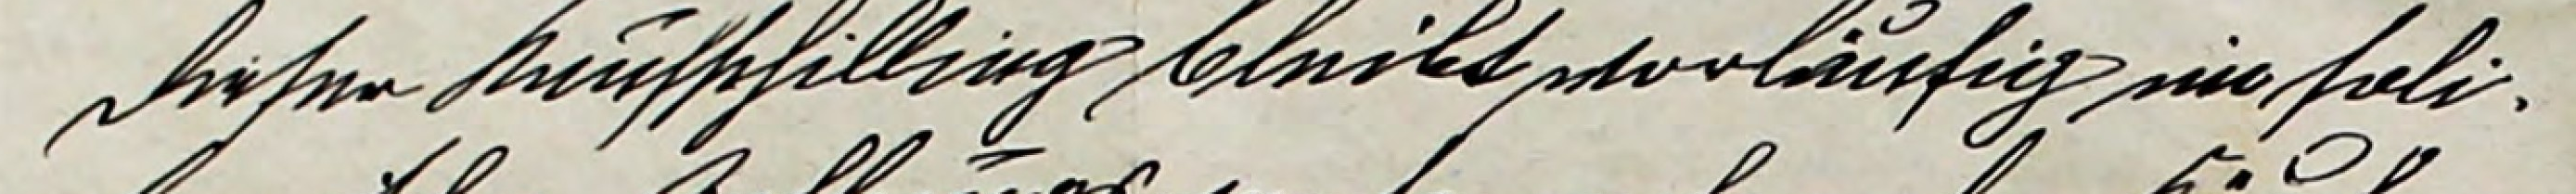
Dieser Kaufschilling Cleibt vorläufig nic fali.
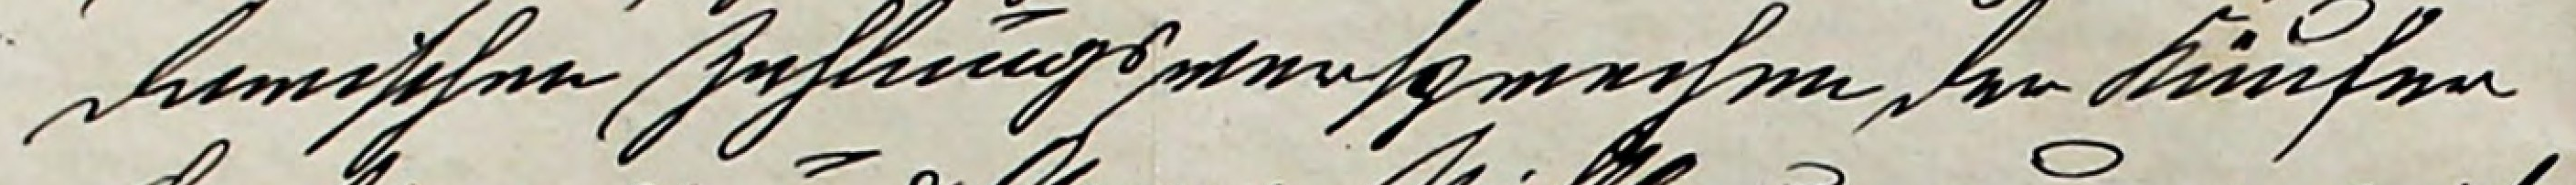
Darischen Zahlungsversprechen der Käufer
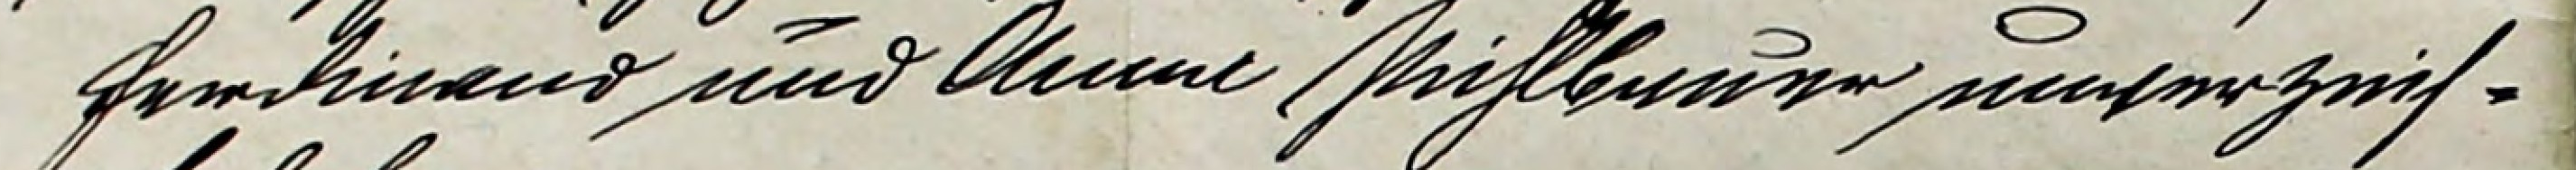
Ferdinand und Anna Pichlbauer unverzeis=
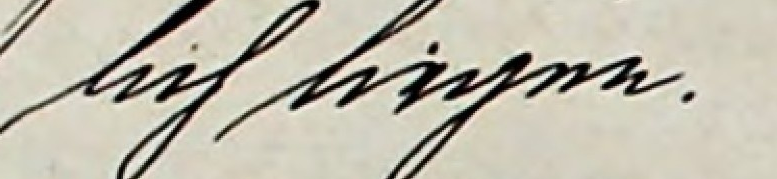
lich liegen.
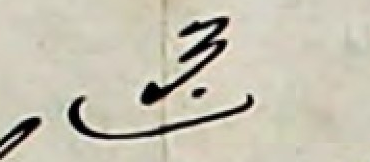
3.
